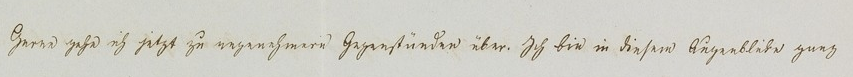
Gerne gehe ich jetzt zu angenehmern Gegenständen über. Ich bin in diesem Augenblicke ganz
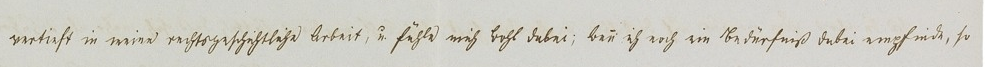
vertieft in meine rechtsgeschichtliche Arbeit, u. fühle mich wohl dabei; wenn ich noch ein Bedürfniß dabei empfinde, so
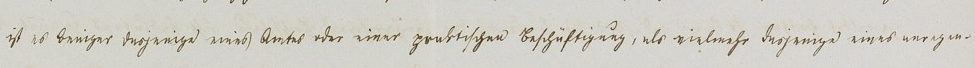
ist es weniger dasjenige eines Amtes oder einer praktischen Beschäftigung, als vielmehr dasjenige eines anregen-
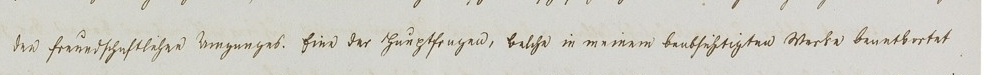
den freundschaftlichen Umganges. Eine der Hauptfragen, welche in meinem beabsichtigten Werke beantwortet
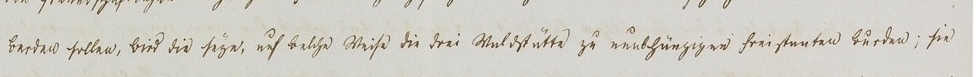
werden sollen, wird die seyn, auf welche Weise die drei Waldstätte zu unabhängigen Freistaaten wurden; sie
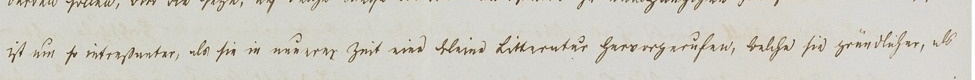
ist um so intreßanter, als sie in neuerer Zeit eine kleine Litteratur hervorgerufen, welche sie gründlicher, als
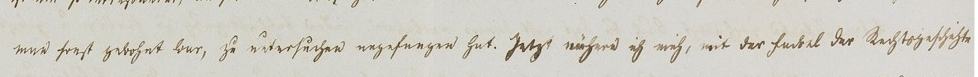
man sonst gewohnt war, zu untersuchen angefangen hat. Jetzt nähere ich mich, mit der Fackel der Rechtsgeschichte
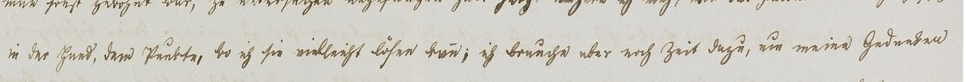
in der Hand, dem Punkte, wo ich sie vielleicht lösen kann; ich brauche aber noch Zeit dazu, um meine Gedanken
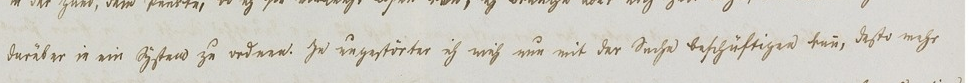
darüber in ein System zu ordnen. Je ungestörter ich mich nun mit der Sache beschäftigen kann, desto mehr
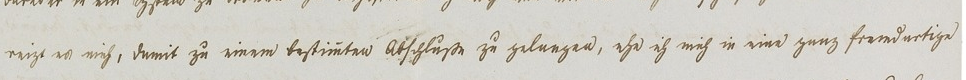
reizt es mich, damit zu einem bestimmten Abschluße zu gelangen, ehe ich mich in eine ganz fremdartige
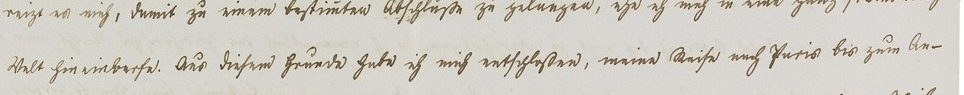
Welt hineinwerfe. Aus diesem Grunde habe ich mich entschloßen, meine Reise nach Paris bis zum An-
